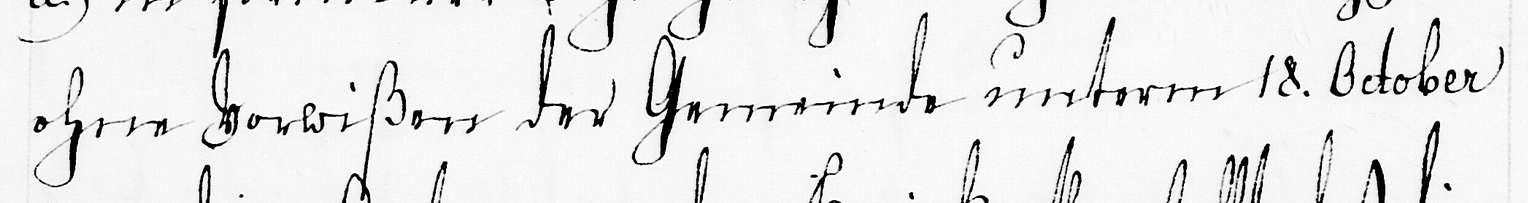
ohne Vorwißen der Gemeinde unterm 18. October
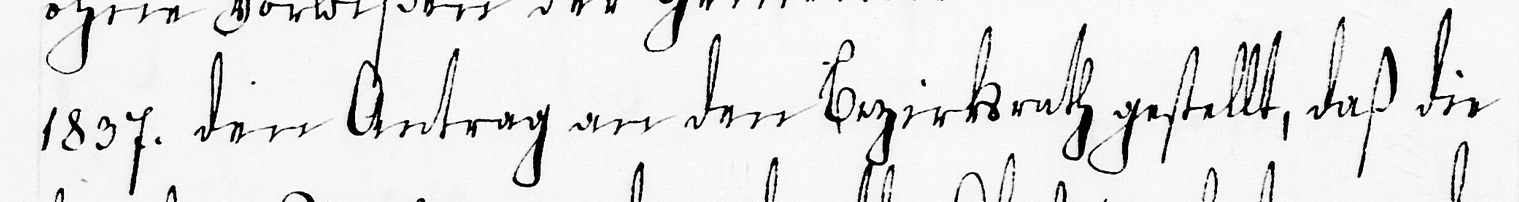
1837. den Antrag an den Bezirksrath gestellt, daß die
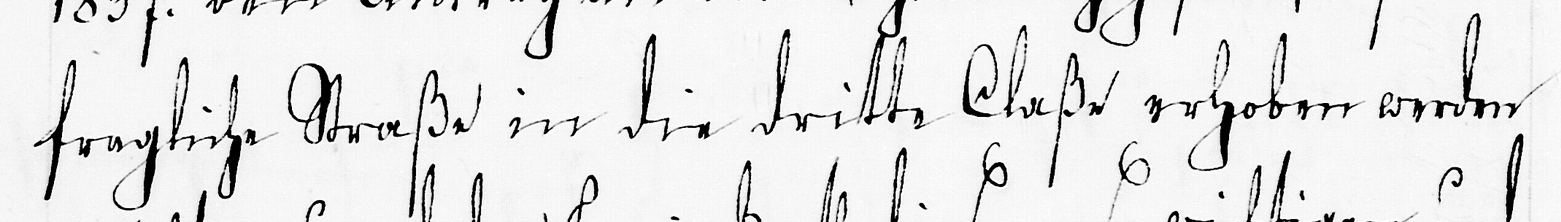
fragliche Straße in die dritte Claße erhoben werden
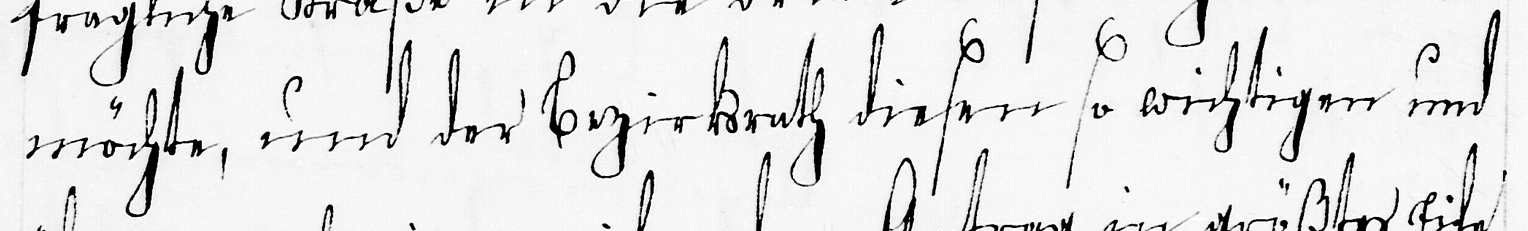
möchte, und der Bezirksrath diesen so wichtigen und
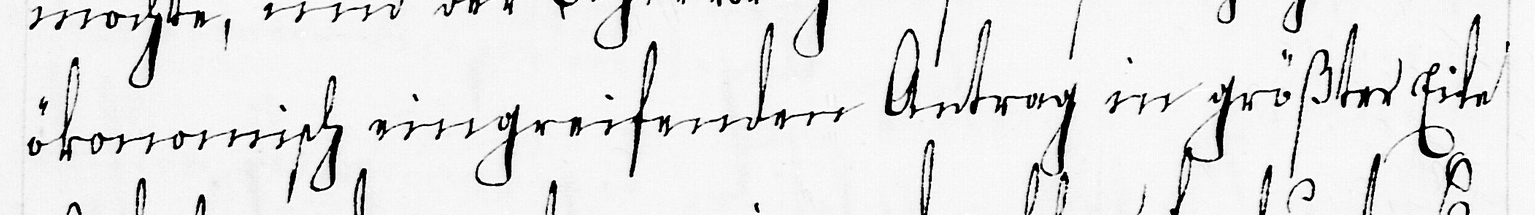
ökonomisch eingreifenden Antrag in größter Eile
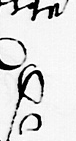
e.
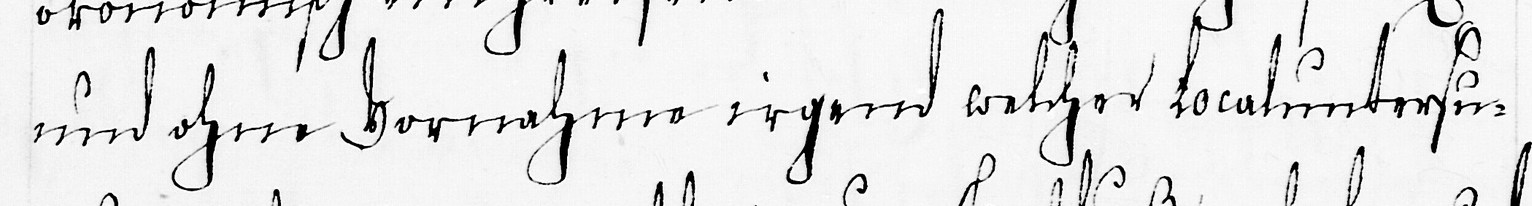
und ohne Vornahme irgend welcher Localuntersu¬
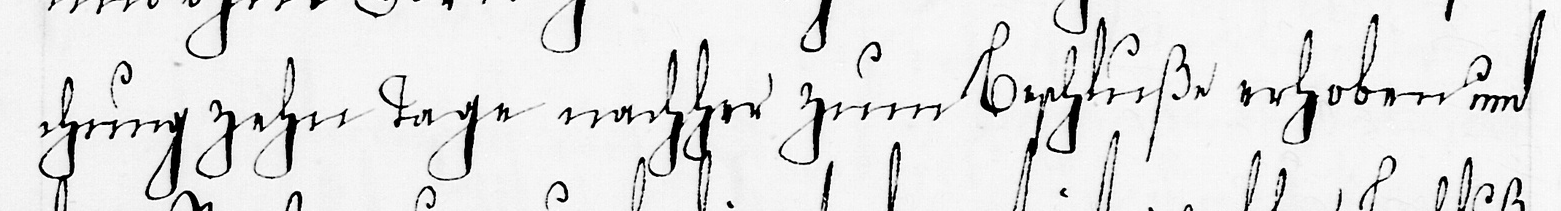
chung zehn Tage nachher zum Beschluße erhoben und
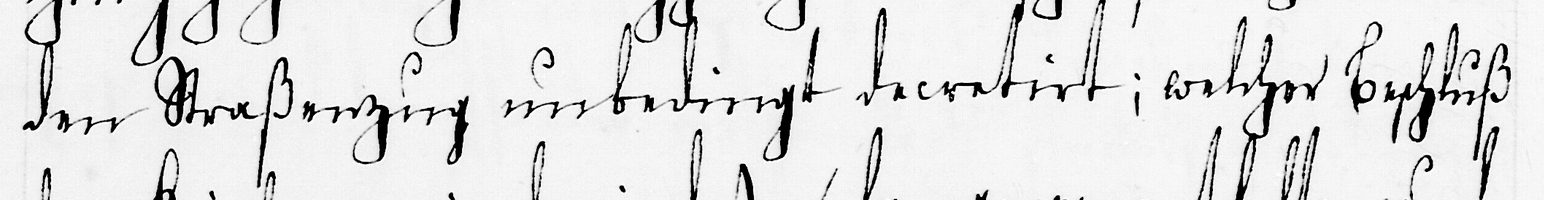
den Straßenzug unbedingt decretirt; welcher Beschluß
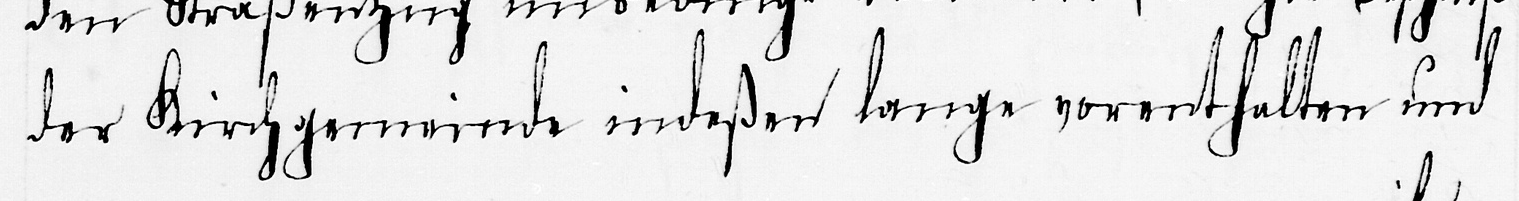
der Kirchgemeinde indeßen lange vorenthalten und
